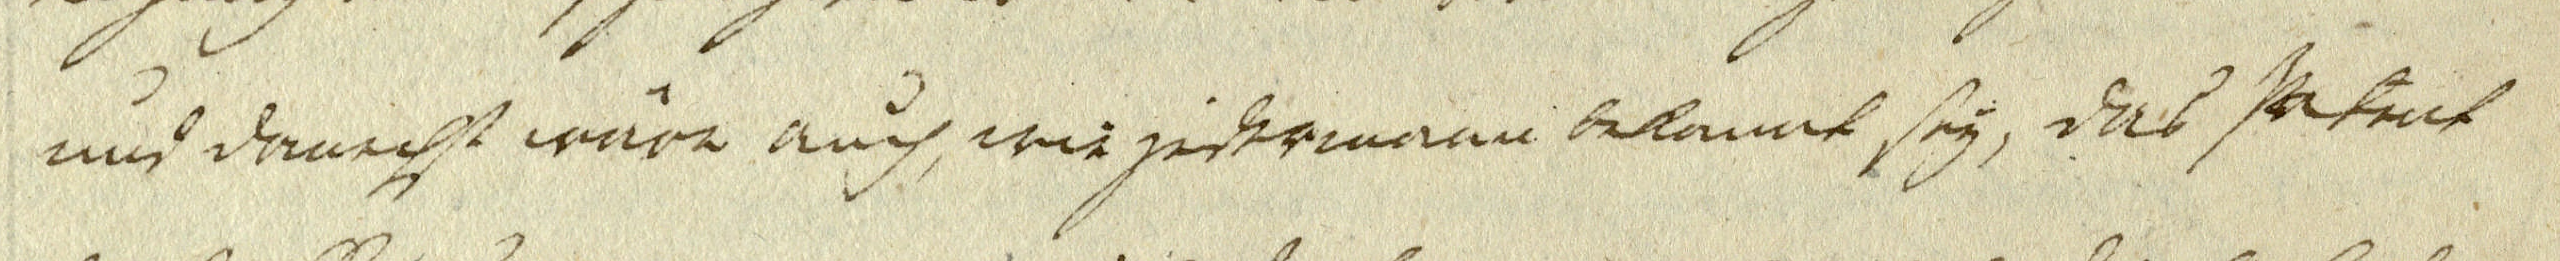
und danechst wäre auch, wie jedermann bekannt seÿ, das Patent
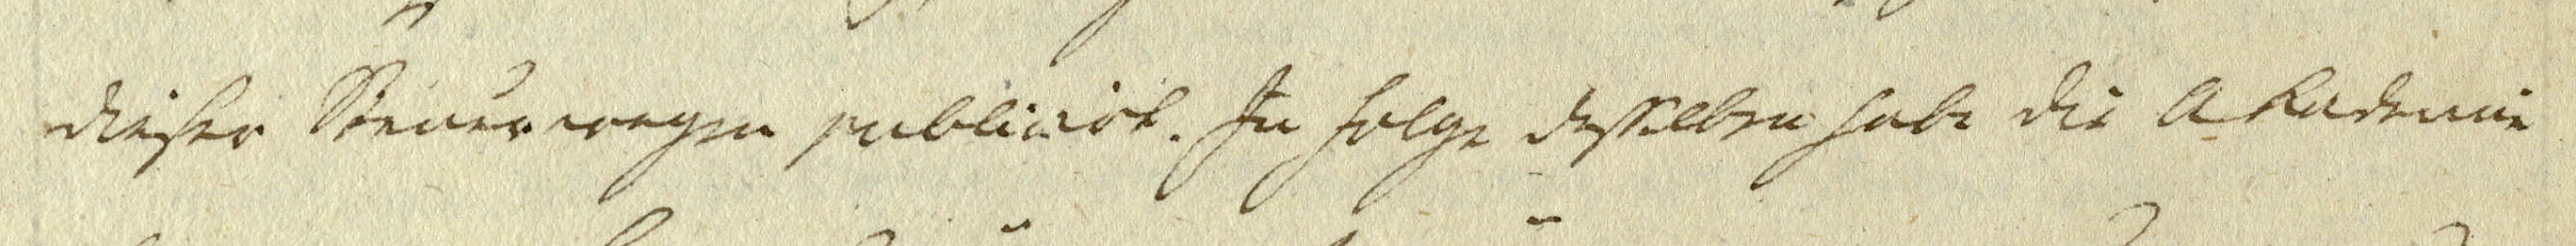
dieser Steuer wegen publiciret. In Folge desselben habe die Akademie
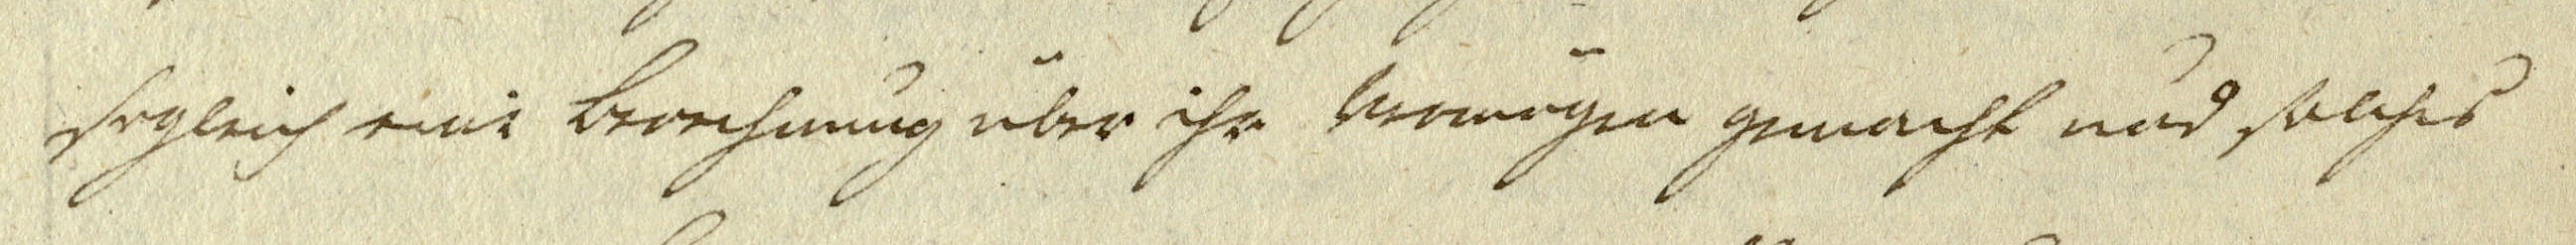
sogleich eine Berechnung über ihr Vermögen gemacht und solches
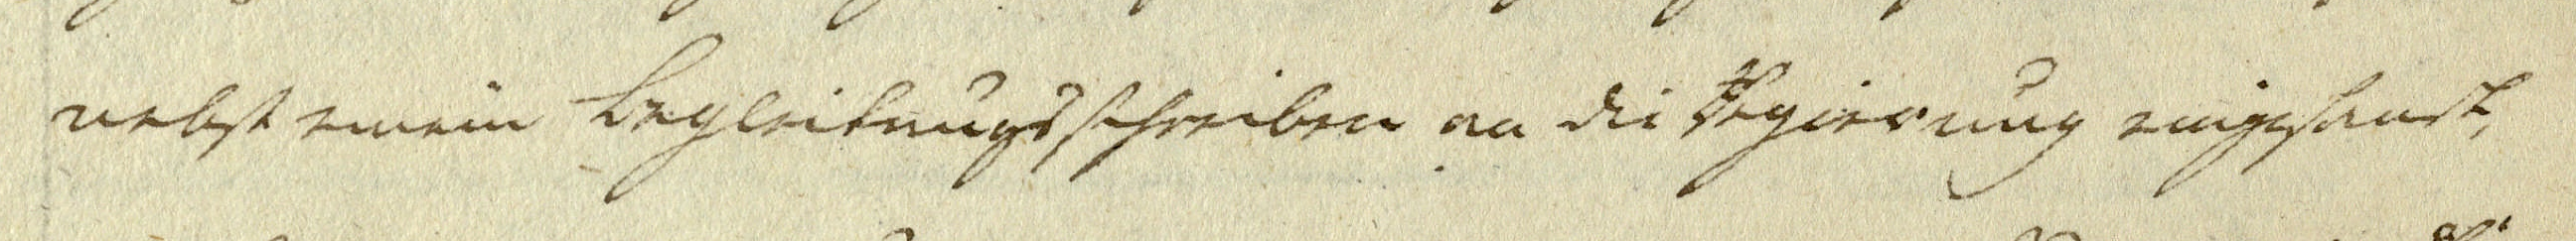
nebst einem Begleitungsschreiben an die Regierung eingesandt,
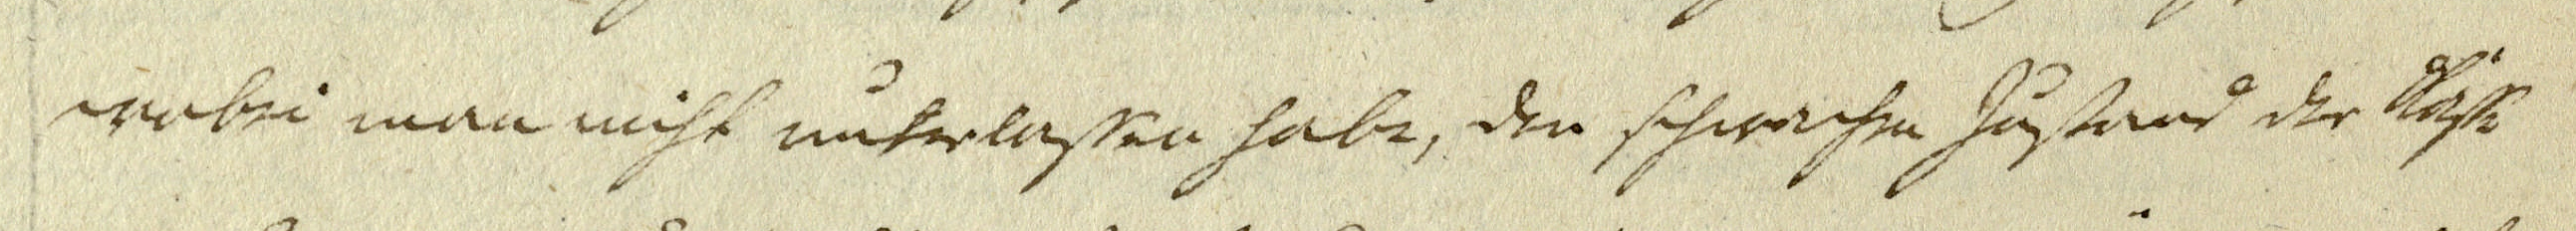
wobei man nicht unterlassen habe, den schwachen Zustand der Kasse
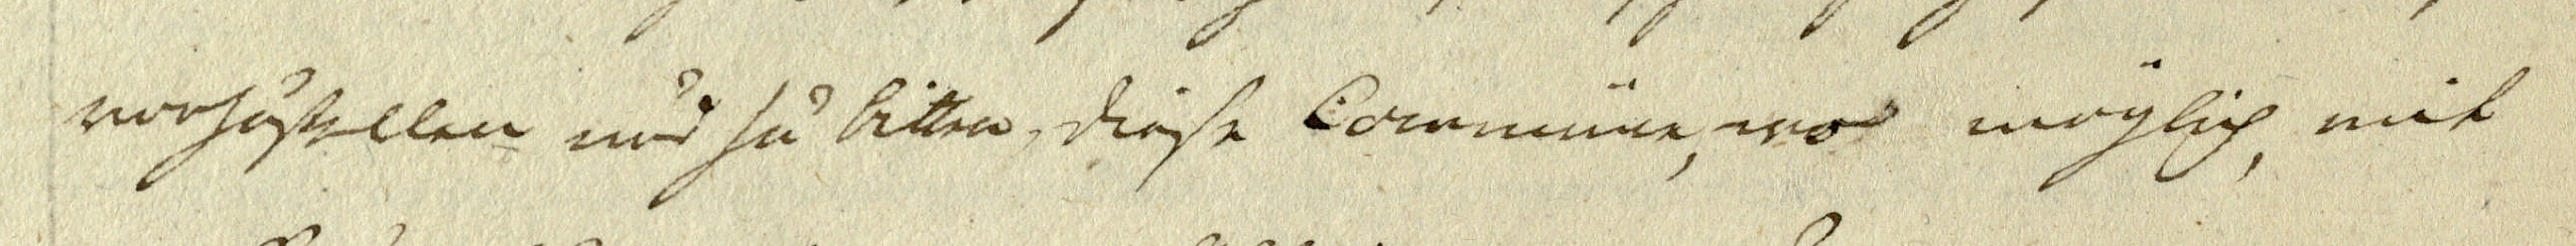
vorzustellen und zu bitten, diese Commüne, wo möglich, mit
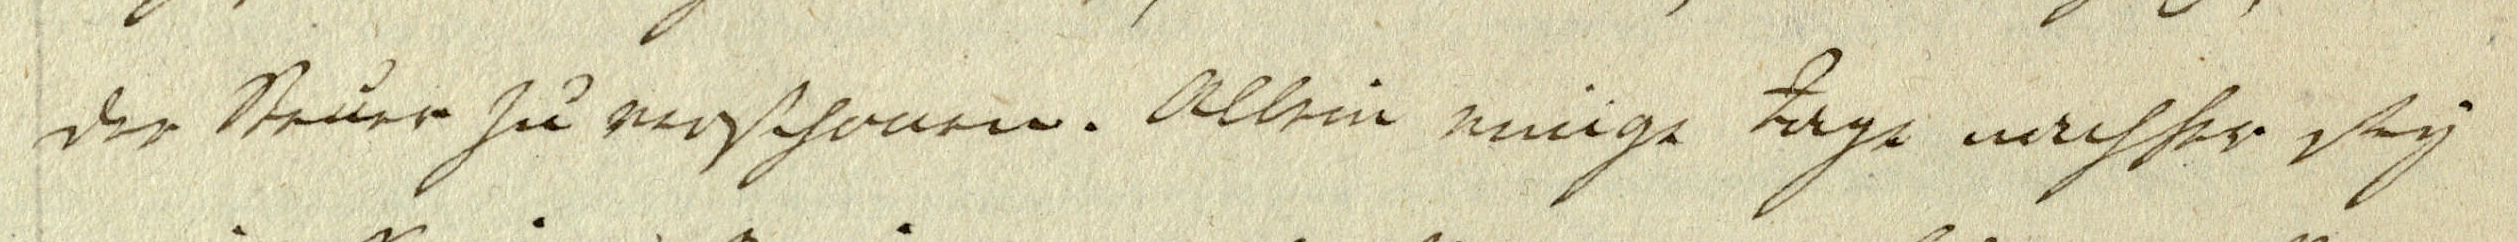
der Steuer zu verschonen. Allein einige Tage nachher seÿ
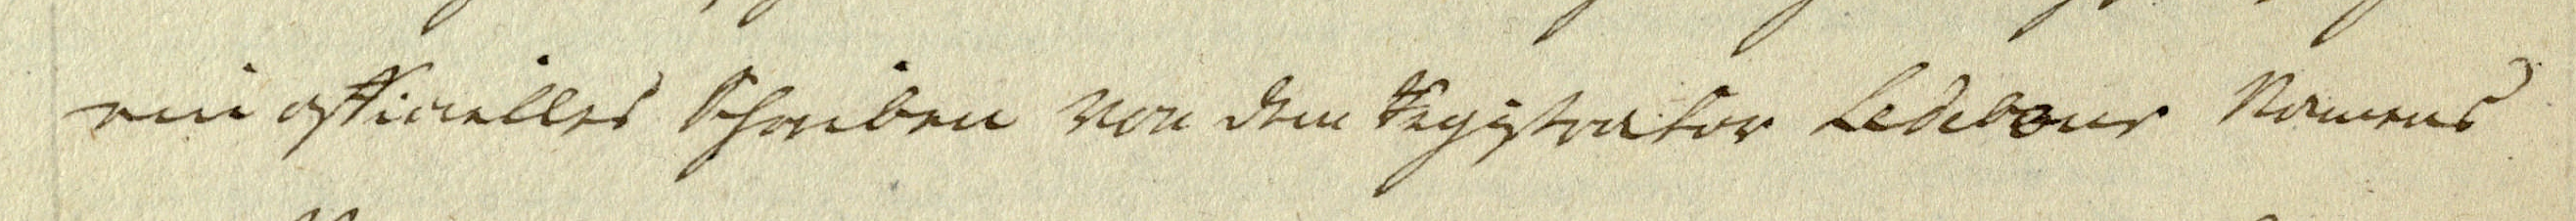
ein officielles Schreiben von dem Registrator Ledebour Namens
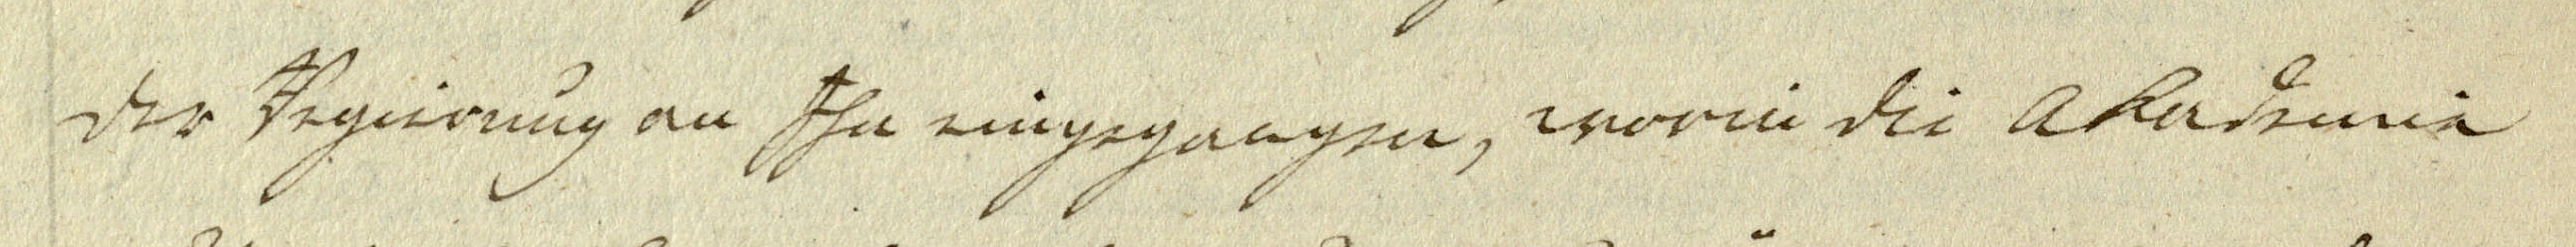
der Regierung an Ihn eingegangen, worin die Akademie
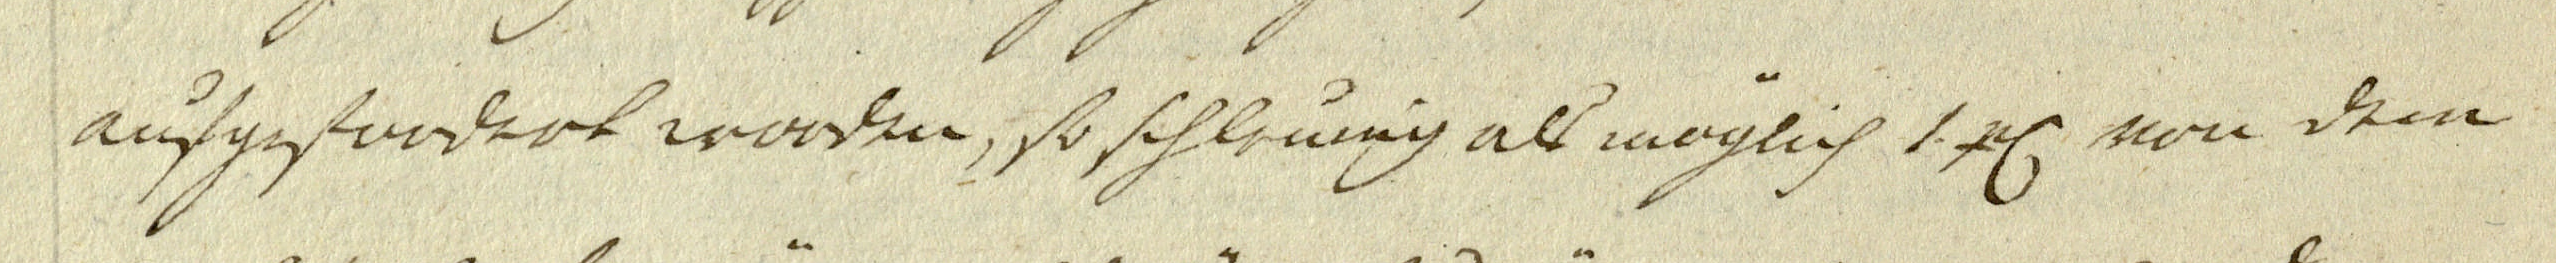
aufgefordert worden, so schleunig als möglich 1 pl. von dem
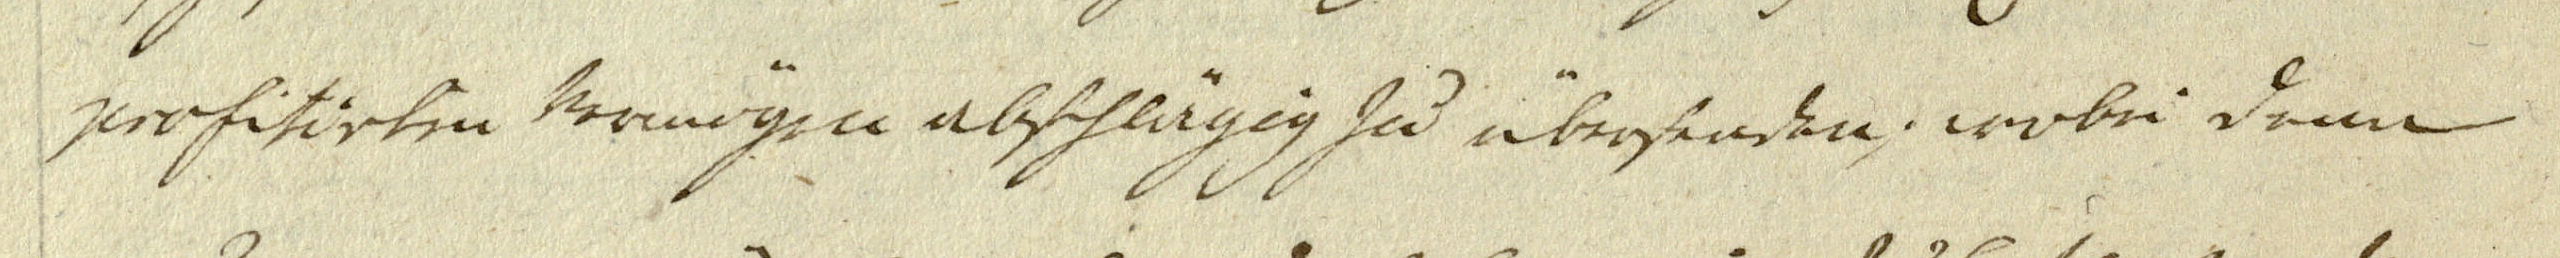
profitirten Vermögen abschlägig zu übersenden, wobei denn
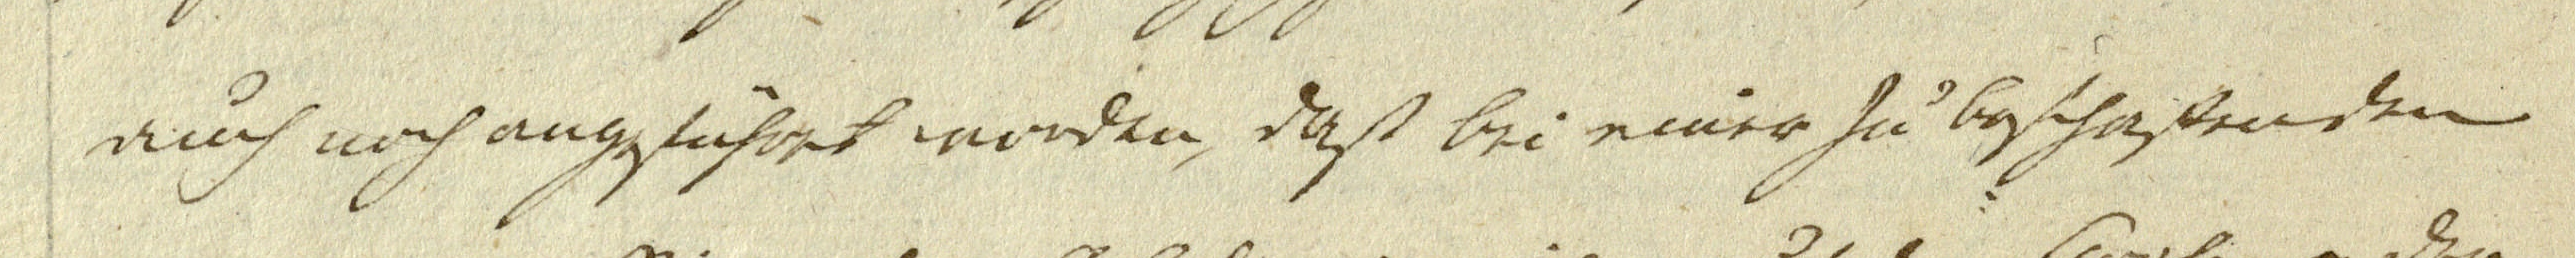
auch noch angeführet worden, daß bei einer zu beschaffenden
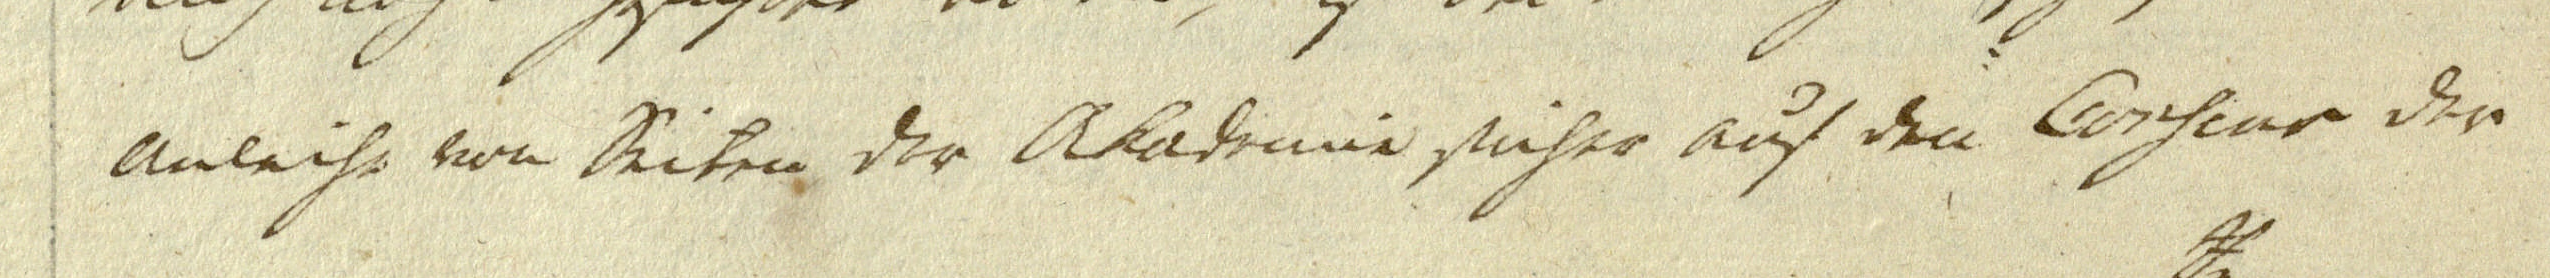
Anleihe von Seiten der Akademie sicher auf den Consens der
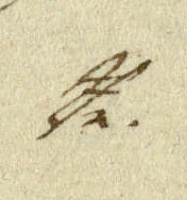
Re.
